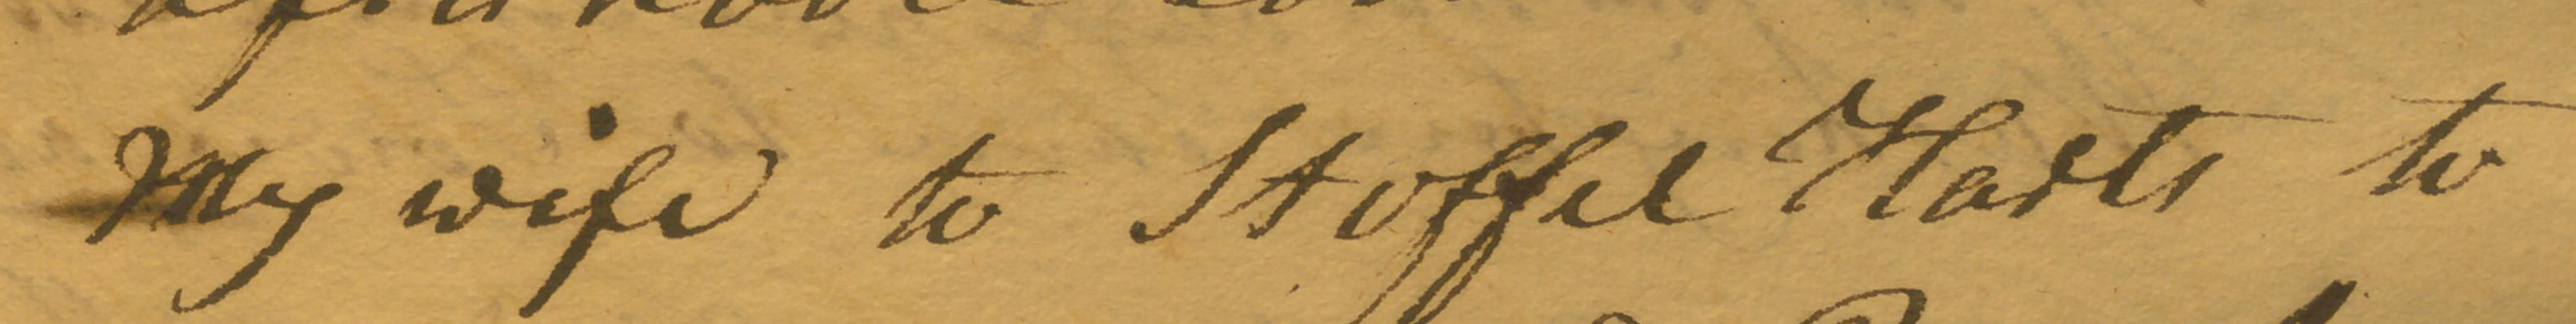My wife to Stoffel Harts to
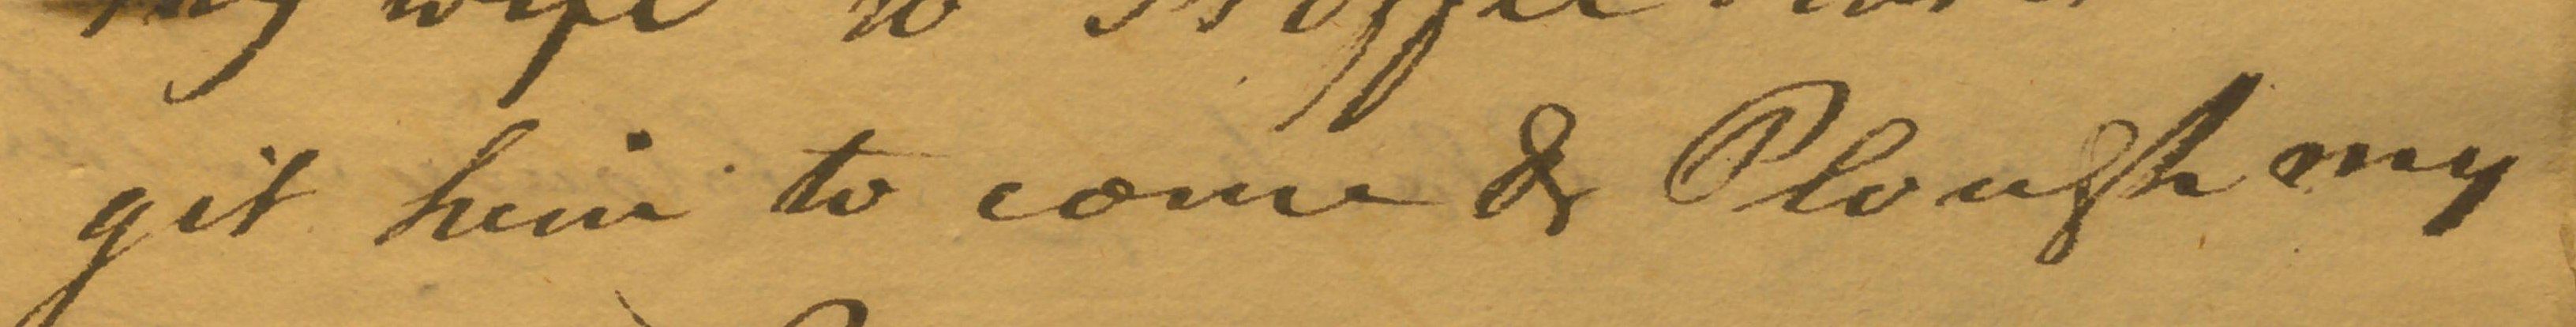git him to come & Plough my
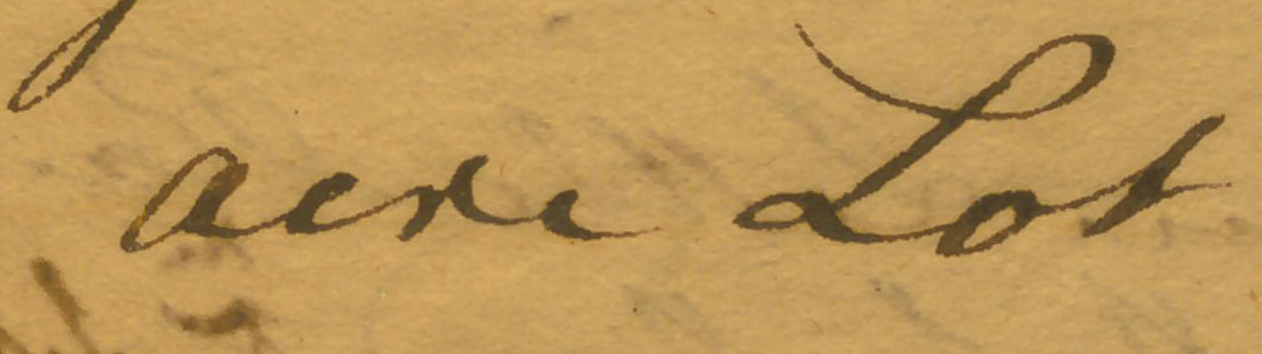acre Lot
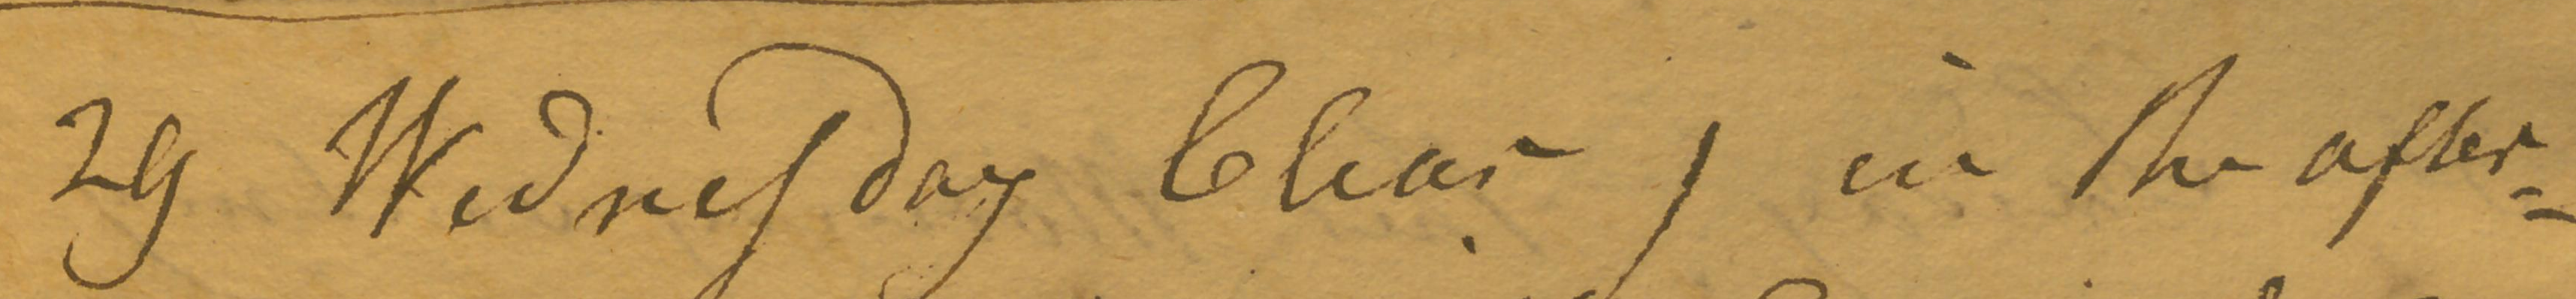29 Wednesday Clear, in the after
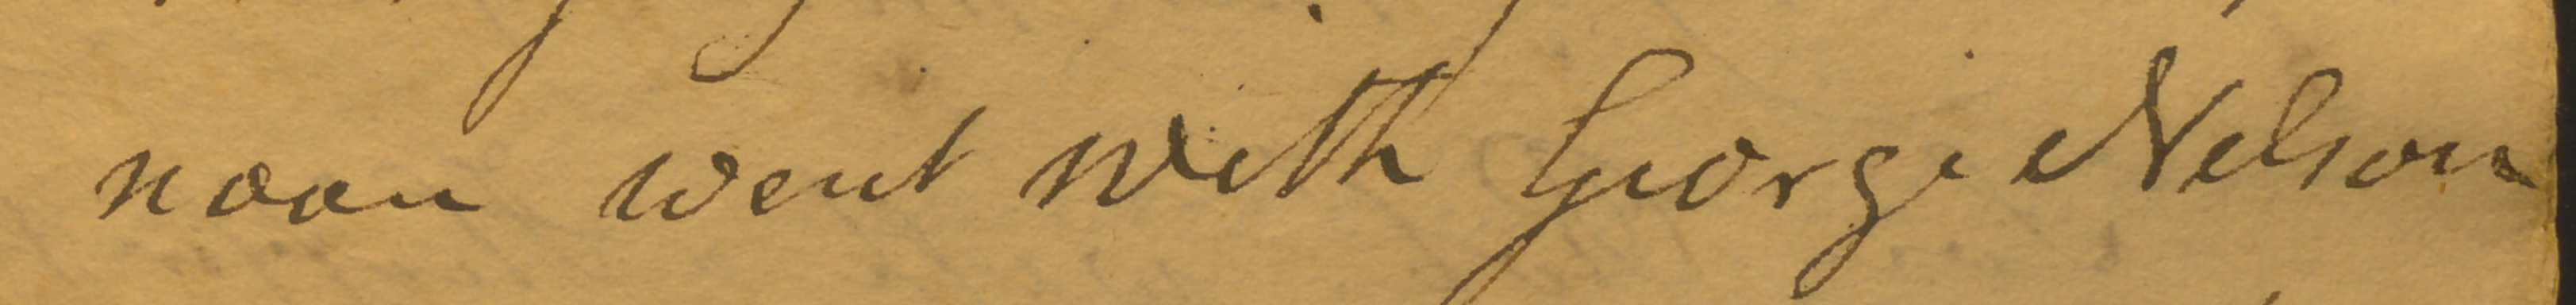noun went with George Nelson
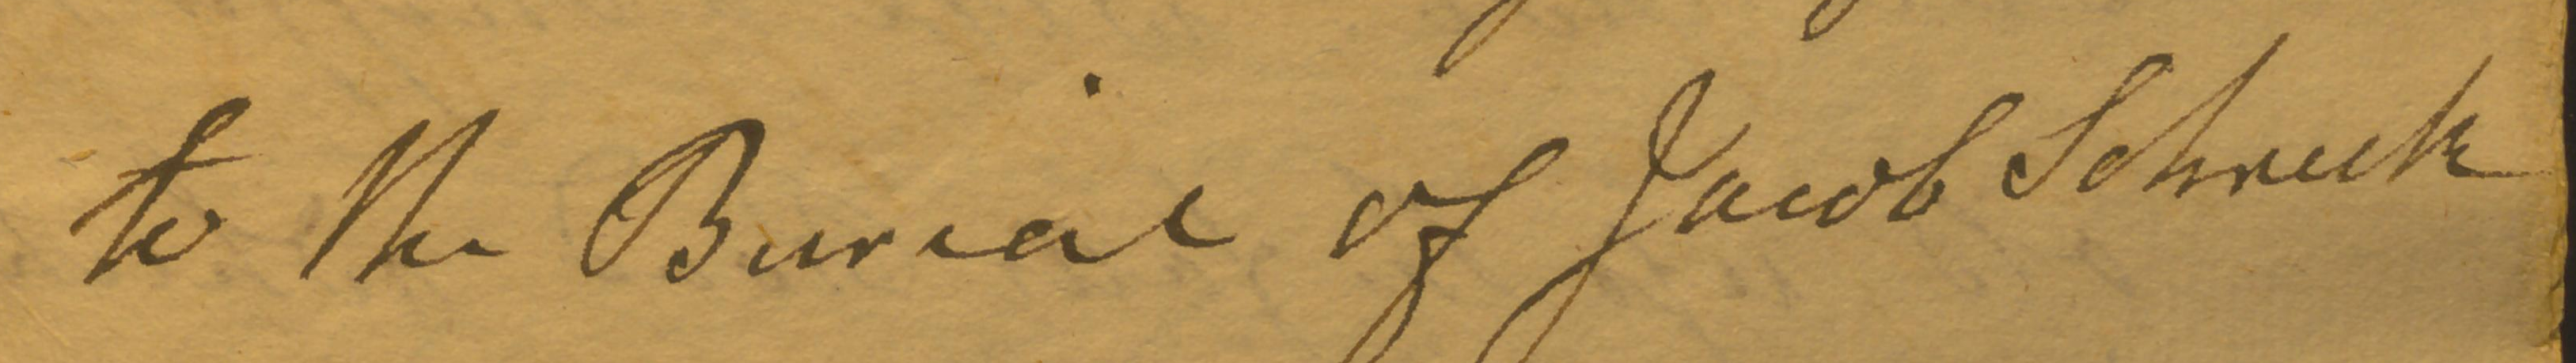to the Burial of Jacob Schreck
